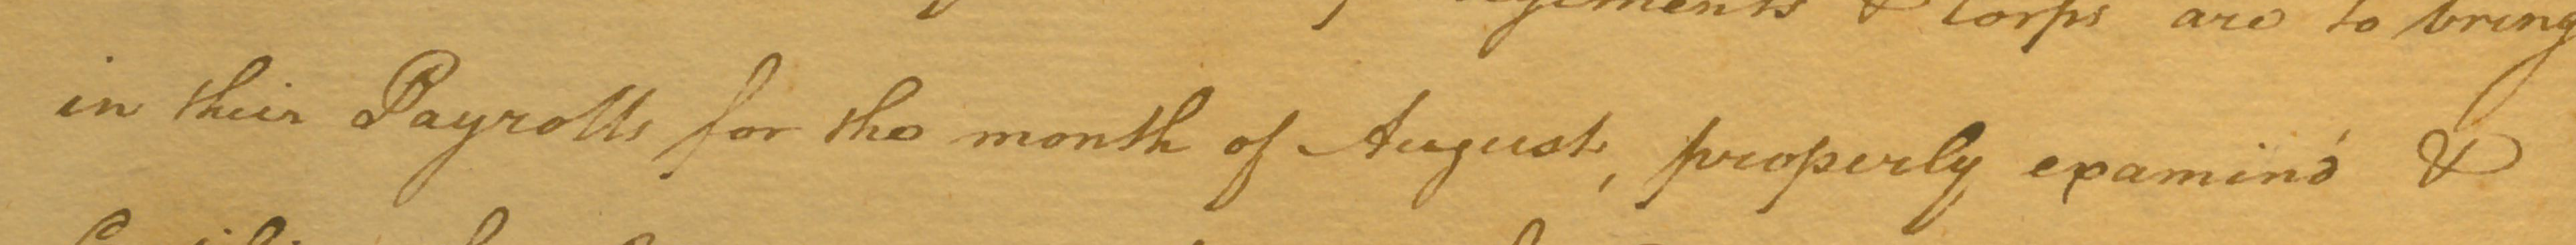in their Payrolls for the month of August, properly examin'd &
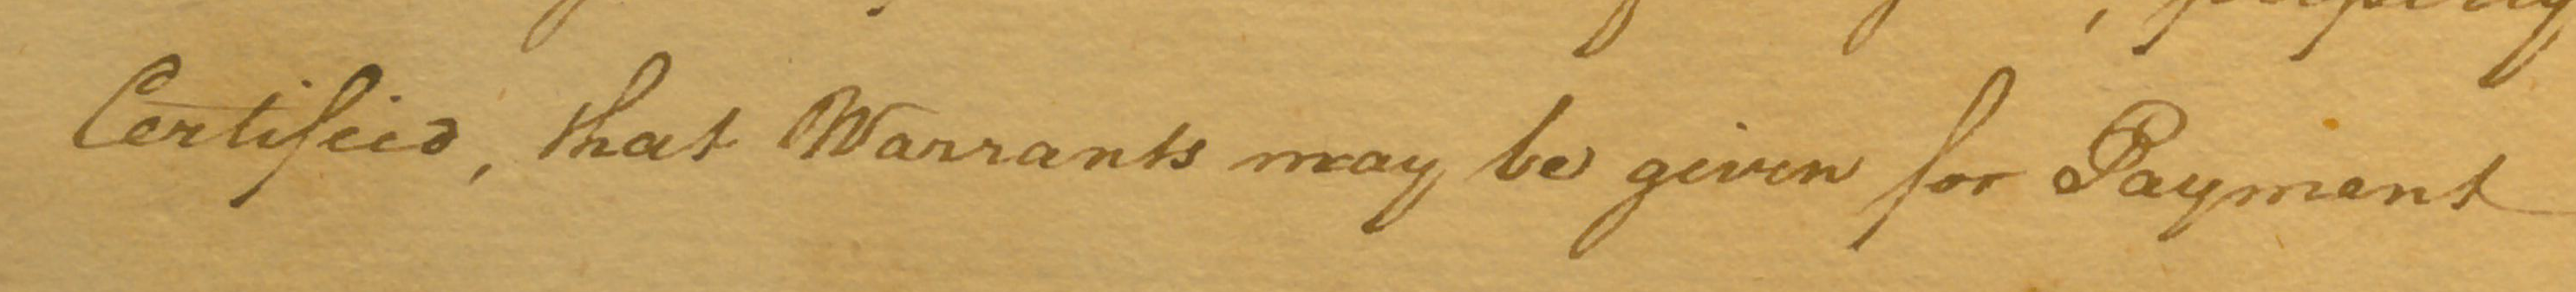Certified, that Warrants may be given for Payment
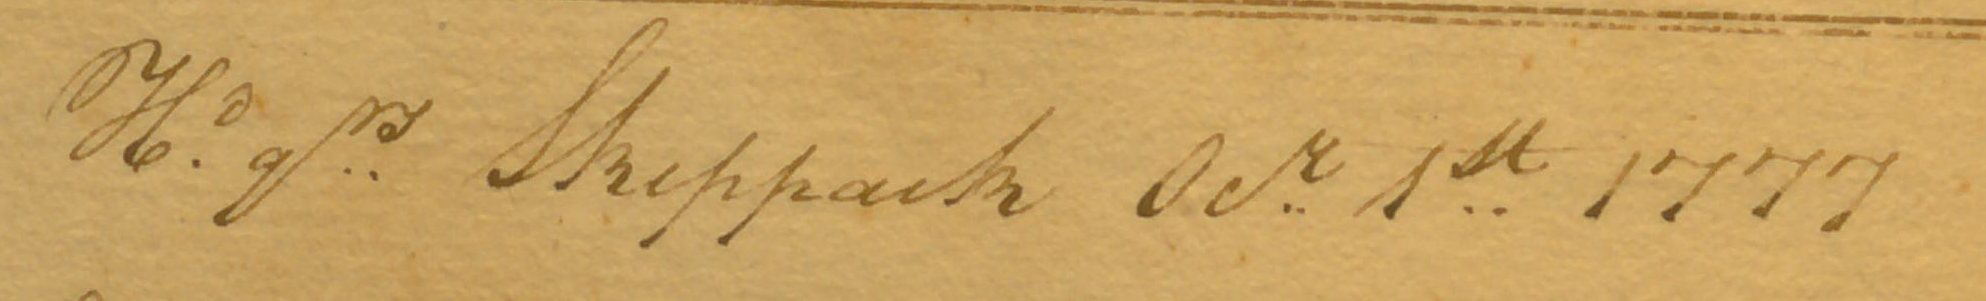H^d. q^rs. Skippack Oc^r. 1^st. 1777
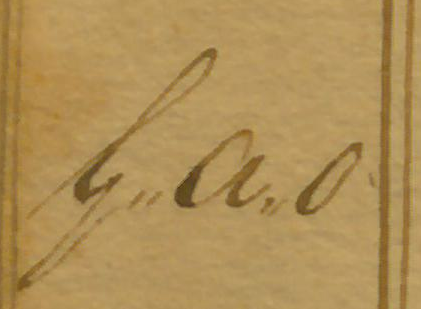G.A.O
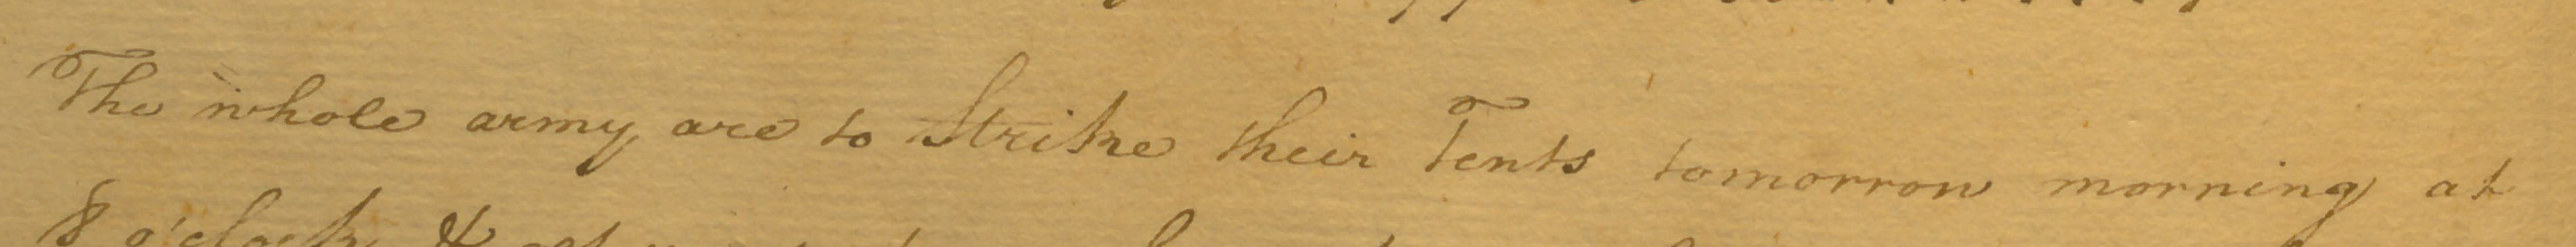The whole army are to Strike their Tents tomorrow morning at
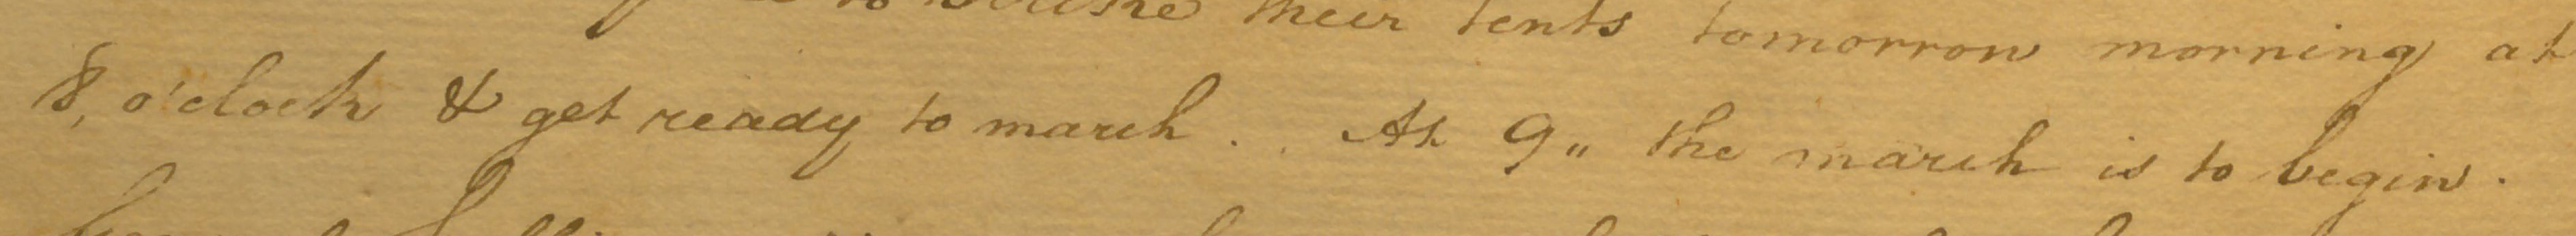8, o'clock & get ready to march. At 9. the march is to begin.
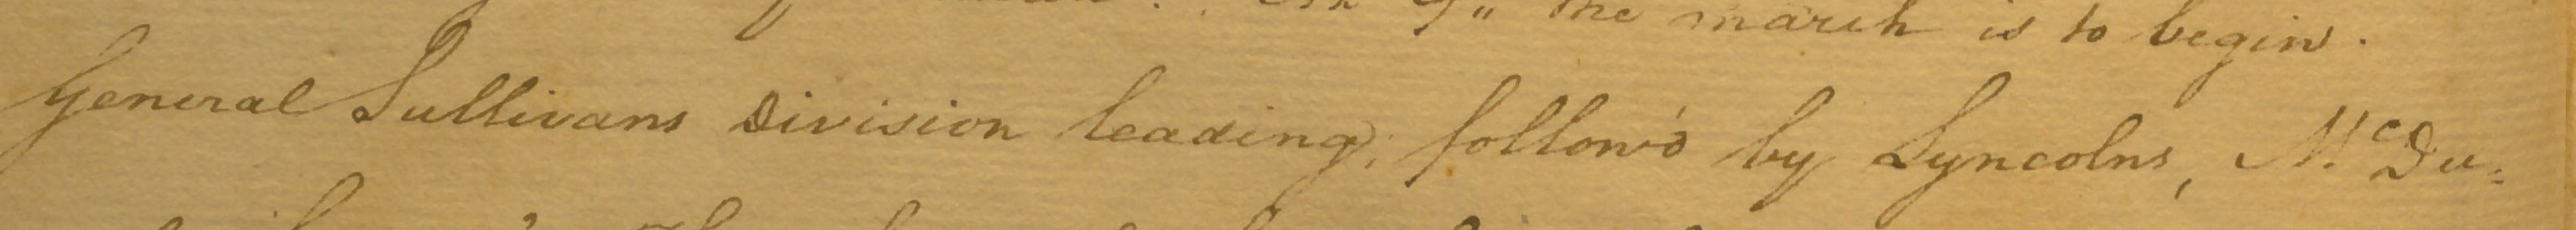General Sullivans Division leading, follow'd by Syncolns, M^c Du-
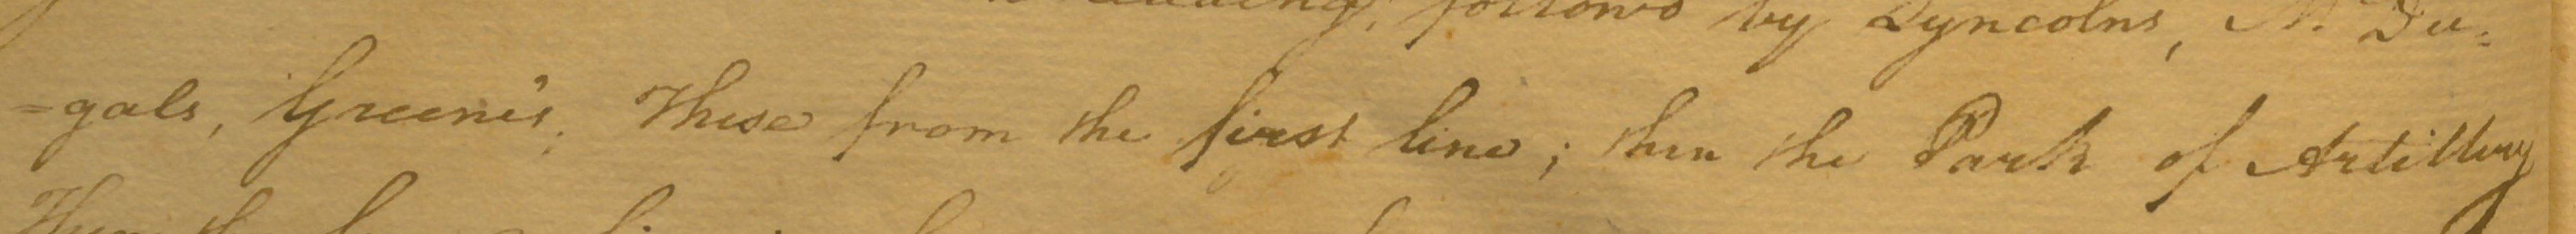-gals, Greene's. These from the first line; then the Park of Artillery
